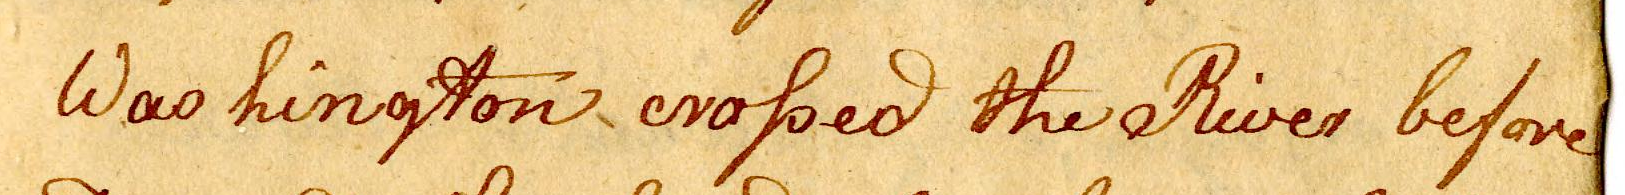Washington crossed the River before
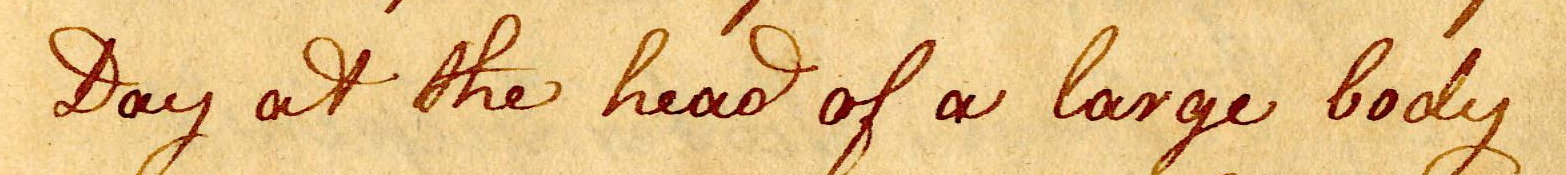Day at the head of a large body
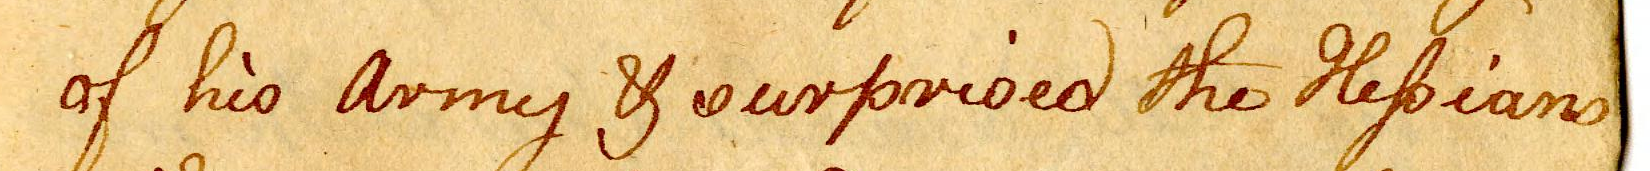of his Army & surprised the Hessians
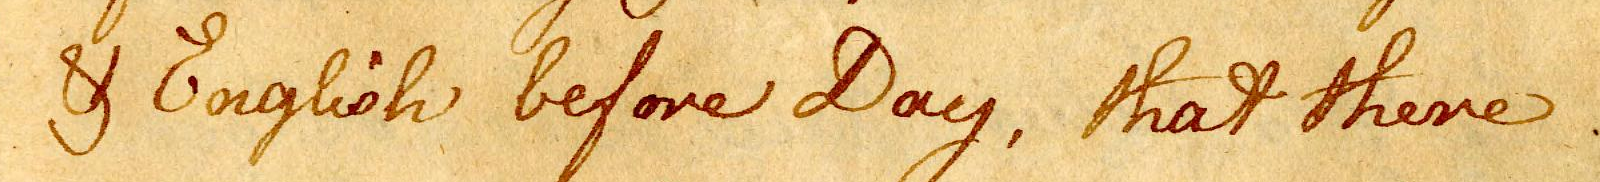& English before Day, that there
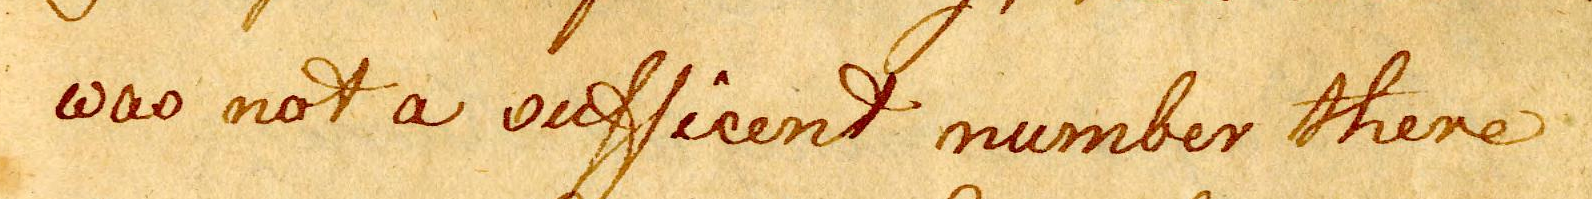was not a sufficent number there
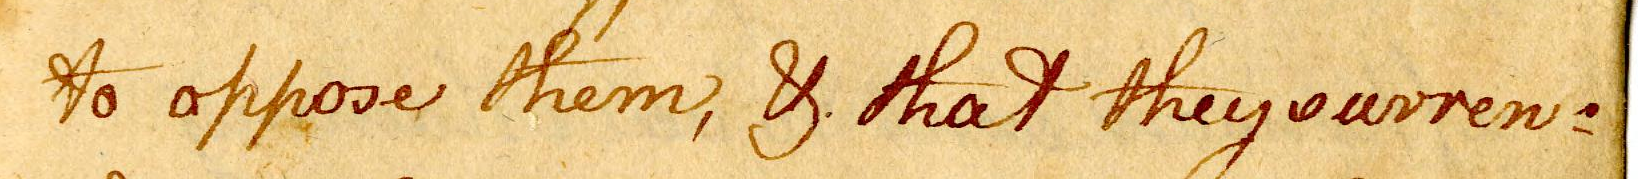to oppose them, & that they surren-
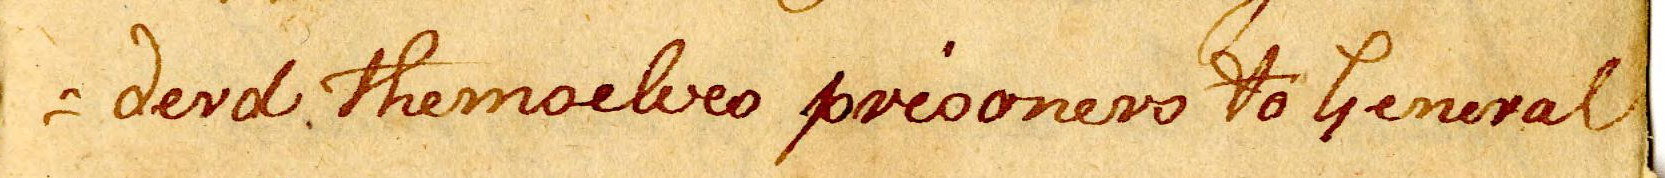-derd themselves prisoners to General
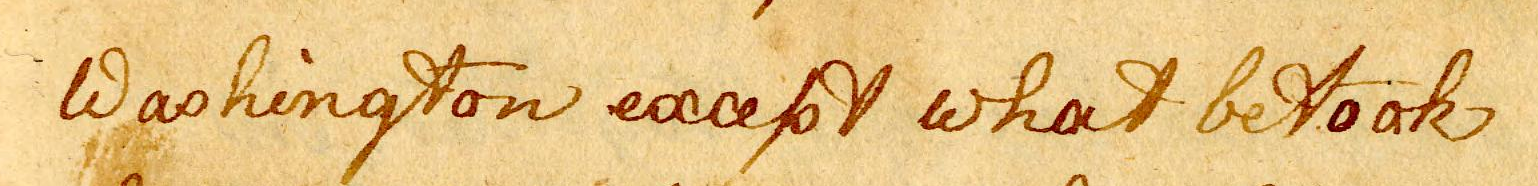Washington except what betook
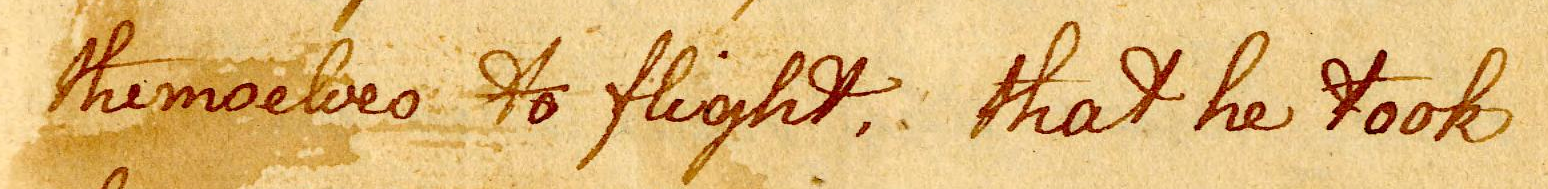themselves to flight, that he took
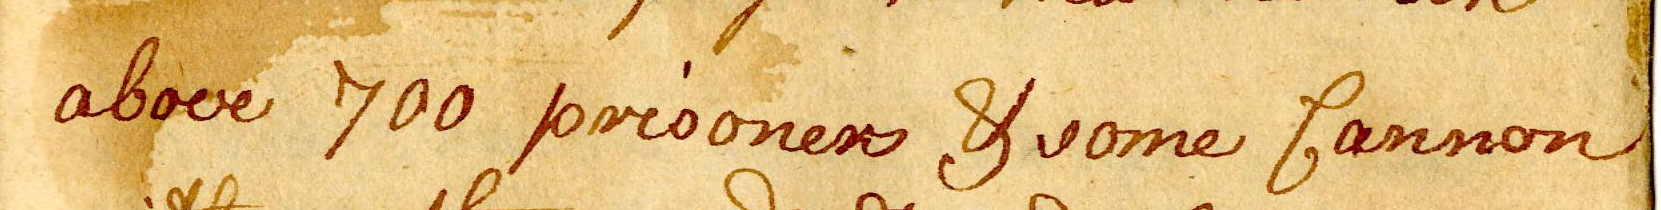above 700 prisoners & some Cannon
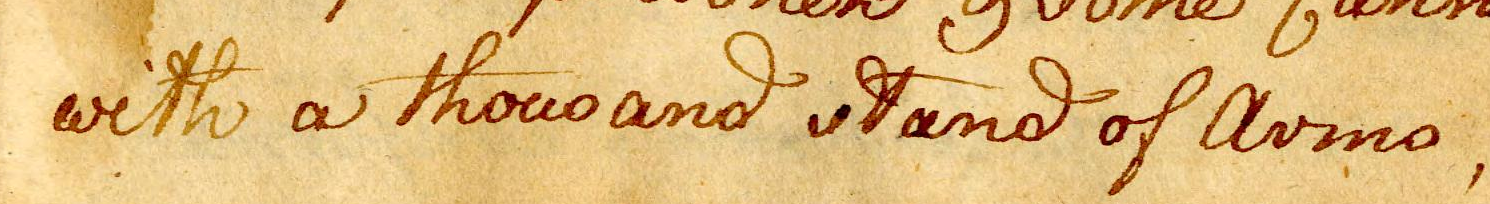with a thousand stand of Arms,
